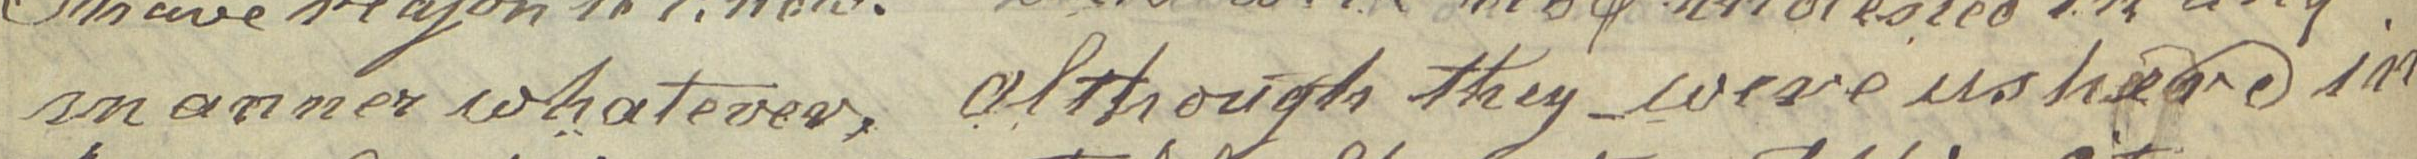manner whatever, although they were ushered in
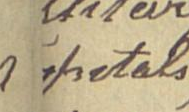-petals
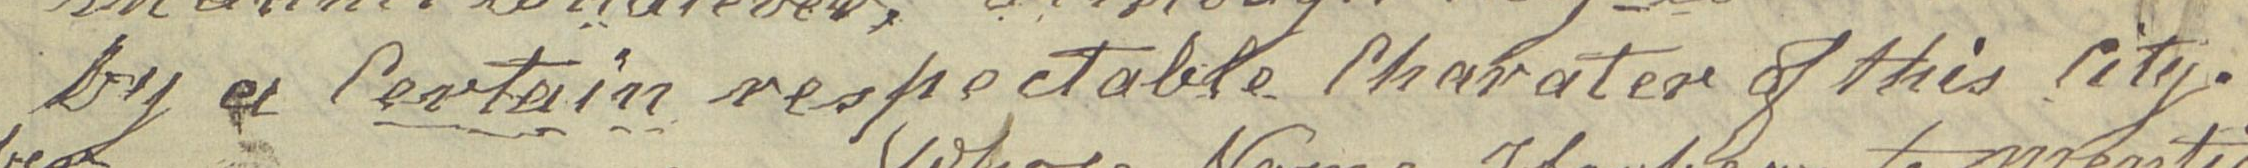by a Certain respectable Charater of this City,
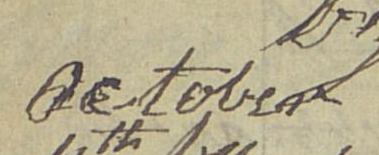October
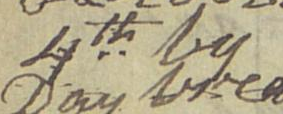4^th. by
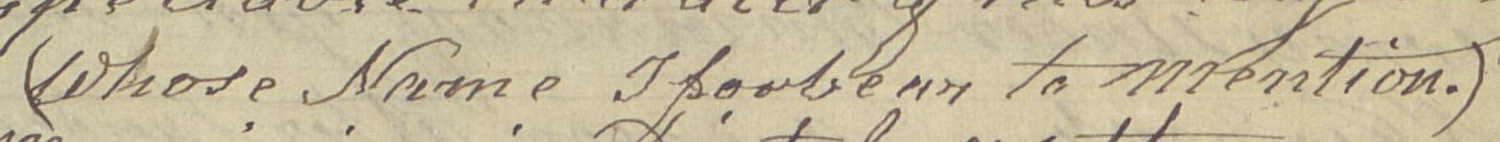(Whose Name I forbear to mention.)
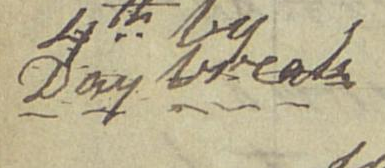Day break
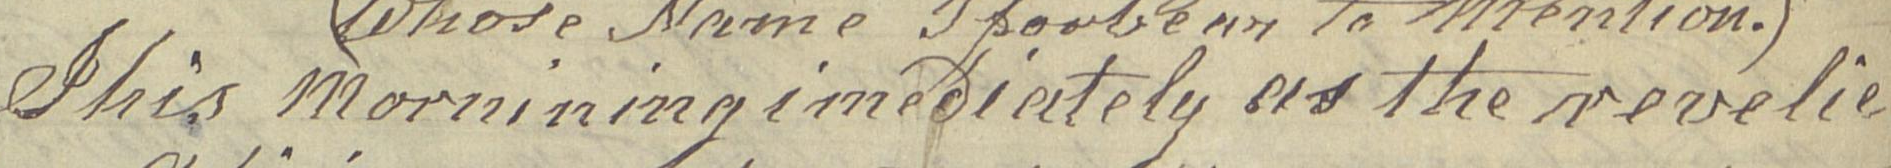This mornining imediately as the revelie
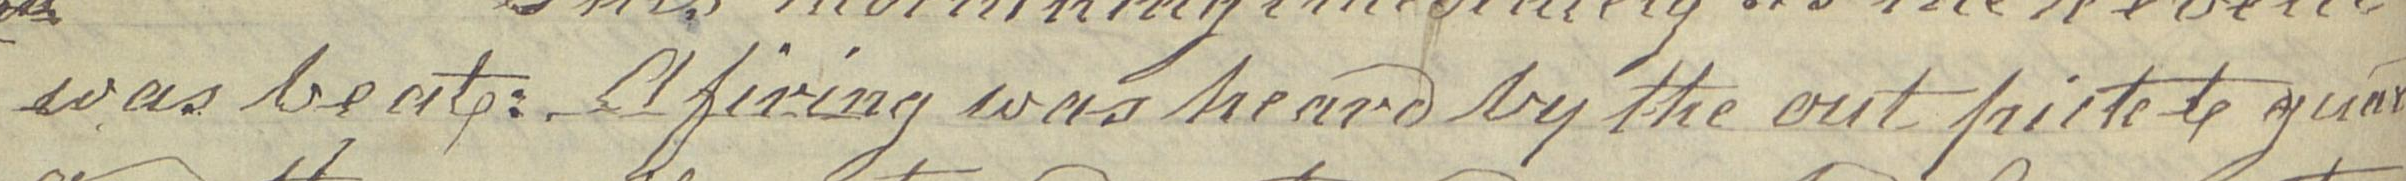was beat: A firing was heard by the out picte to guard
